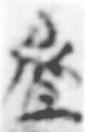益
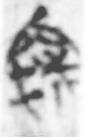探
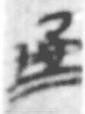爲
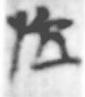○（左）
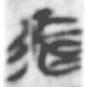飛（騑）
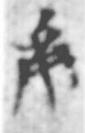甫
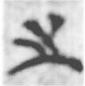之
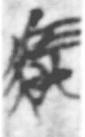駟
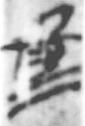爲
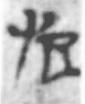○（左）
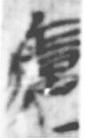驂
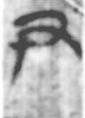尹
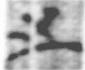之
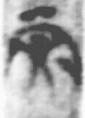兩
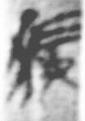駟
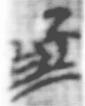爲
